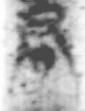君
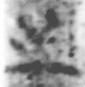之
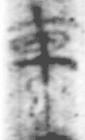車
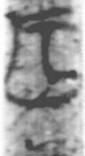○（圓）
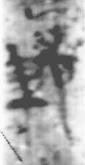軒
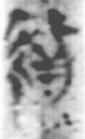紫
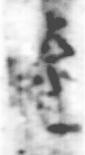○（錦）
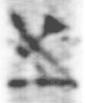之
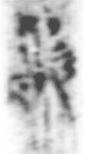○（表）
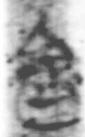裏
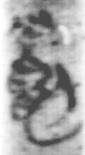○（貂）
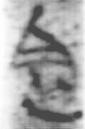定
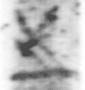之
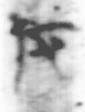反
